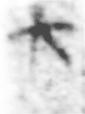大
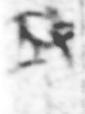攻（工）
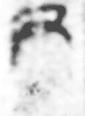尹
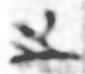之
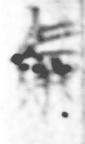駟
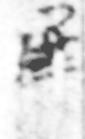爲
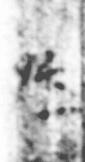○（左）
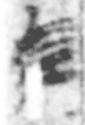驂
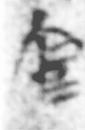○（中）
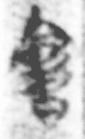○（守）
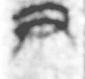尹
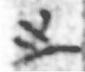之
